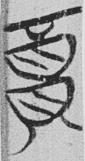○（富）
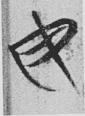母
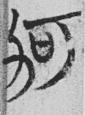○（抲）
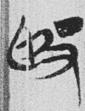○（賢）
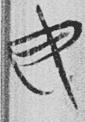母
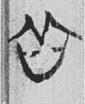向
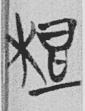梪
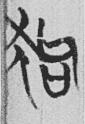狗（耉）
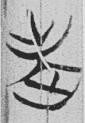老
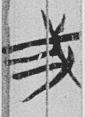弍（二）
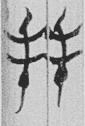拜
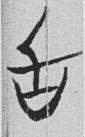旨（稽）
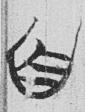首
